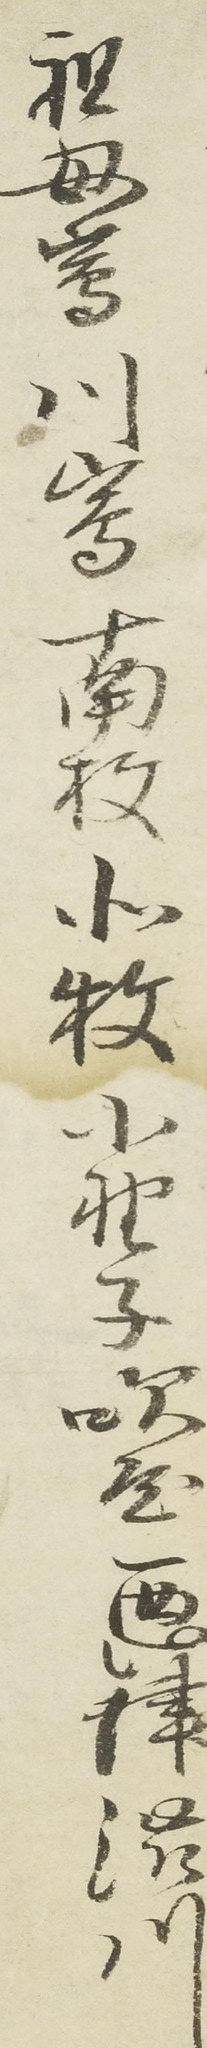祖母嶋川嶋南牧北牧小野子吹屋悪津渋川
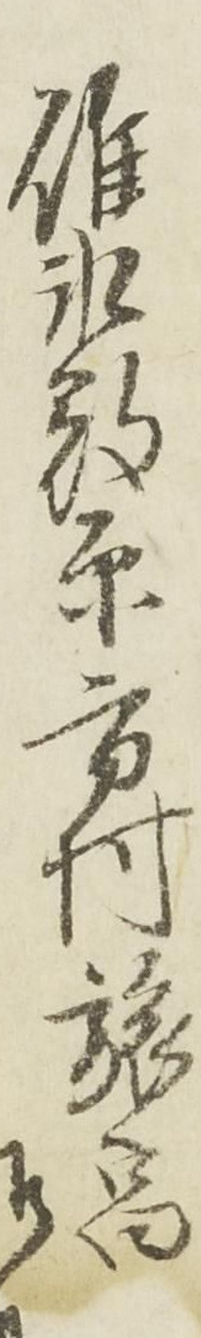碓氷郡原方村旅宿
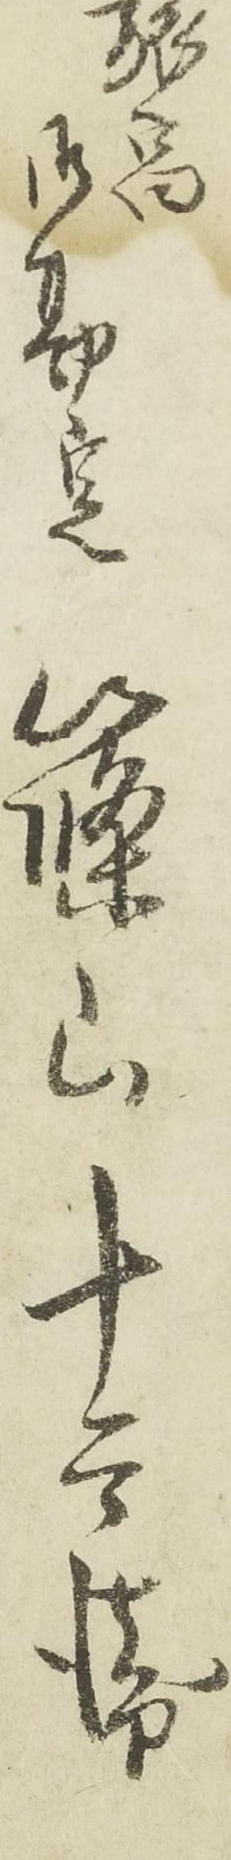御勘定篠山十兵衛
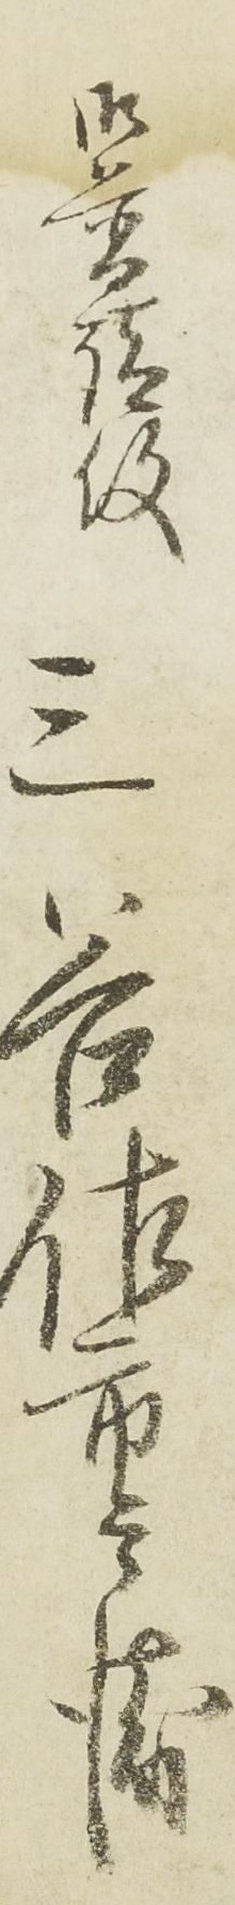御普請役三谷佐市兵衛
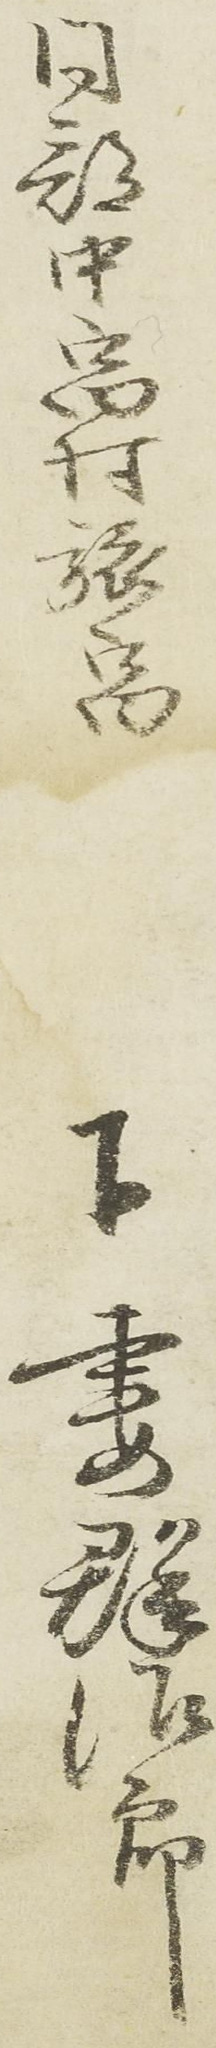同郡中富村旅宿下妻群治郎
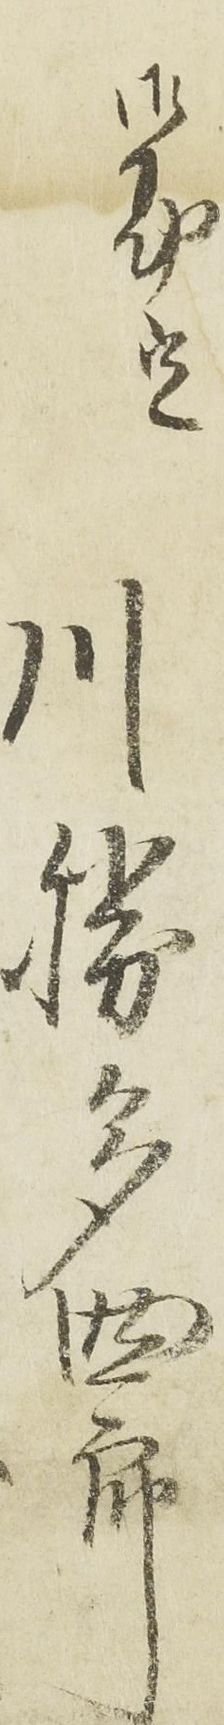御勘定川勝多四郎
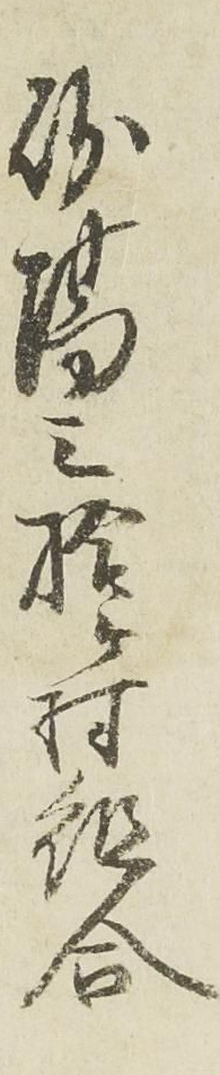砂場三拾ケ村組合
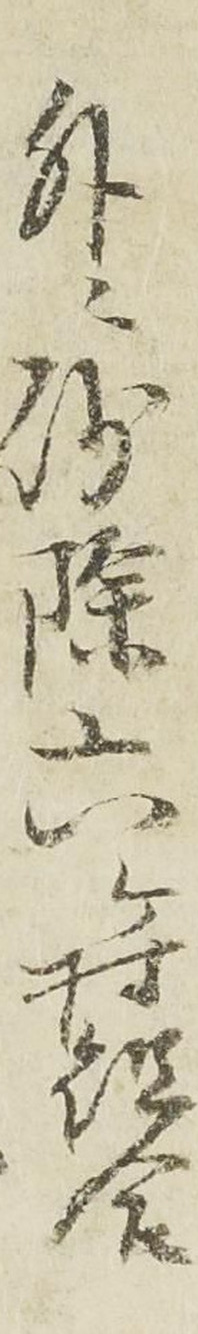外ニ砂除六ケ村組合
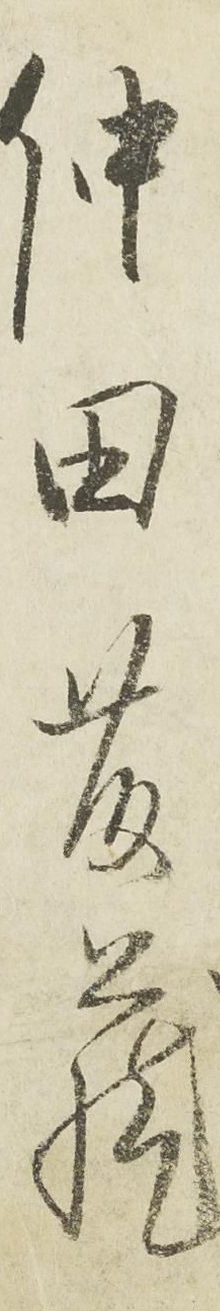仲田藤蔵
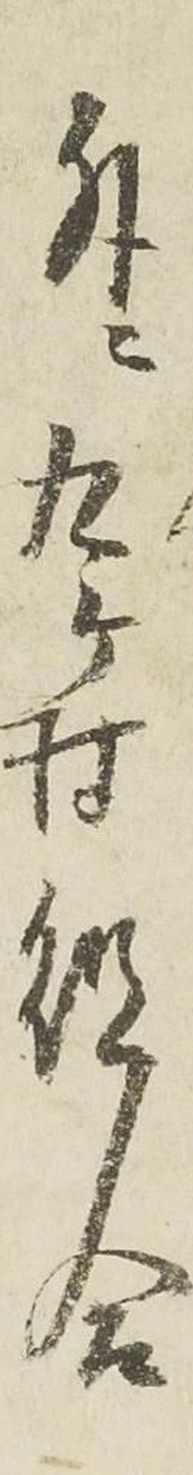外ニ九ケ村組合
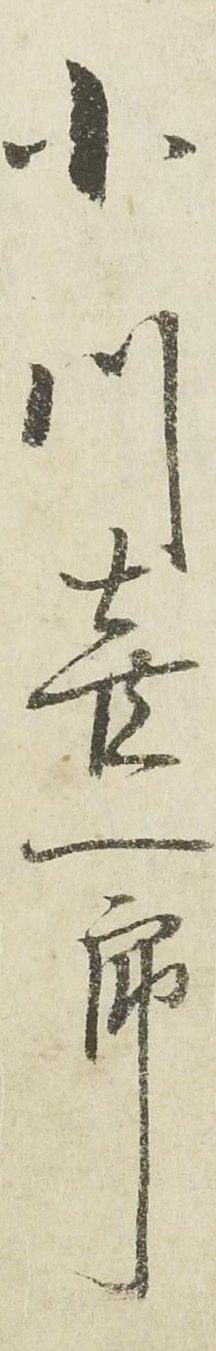小川喜一郎
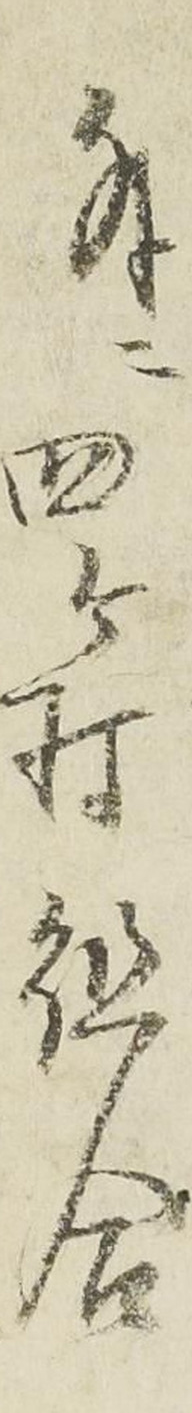外ニ四ケ村組合
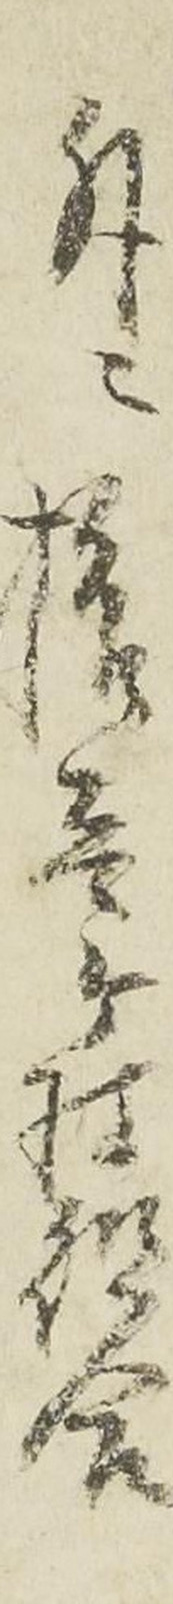外ニ拾壱ケ村組合
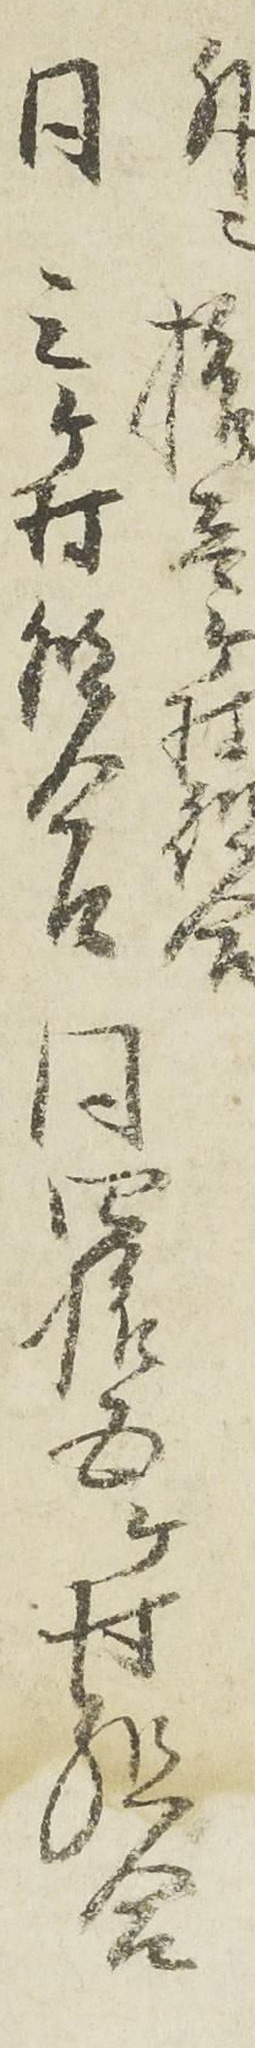同三ケ村組合同四拾五ケ村組合
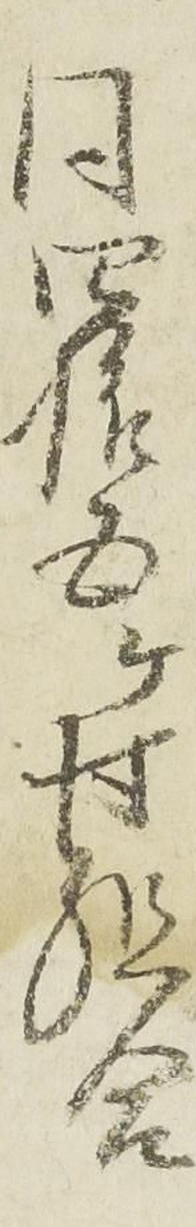外ニ拾壱ケ村組合
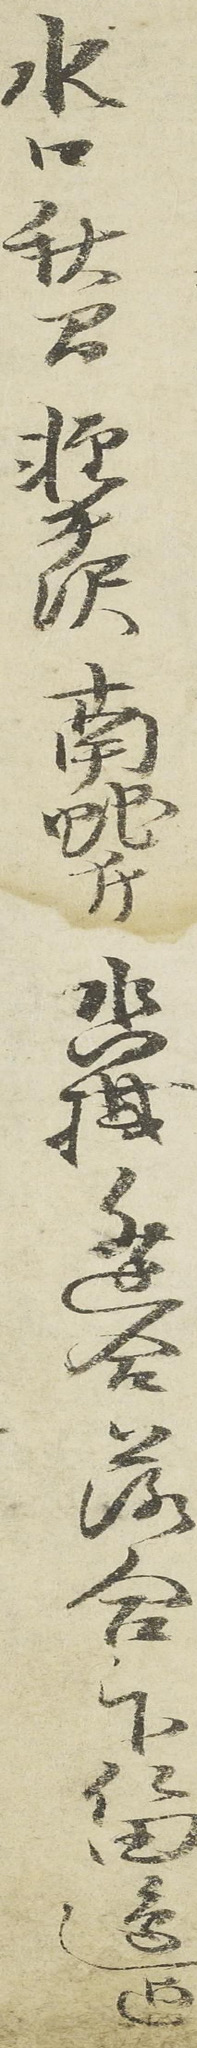水口秋間軽井沢南蛇井水口城くみ合落合下仁田辺込
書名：浅間大変略記
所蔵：東京大学地震研究所図書室 Earthquake Research Institute Library, The University of Tokyo, JAPAN
